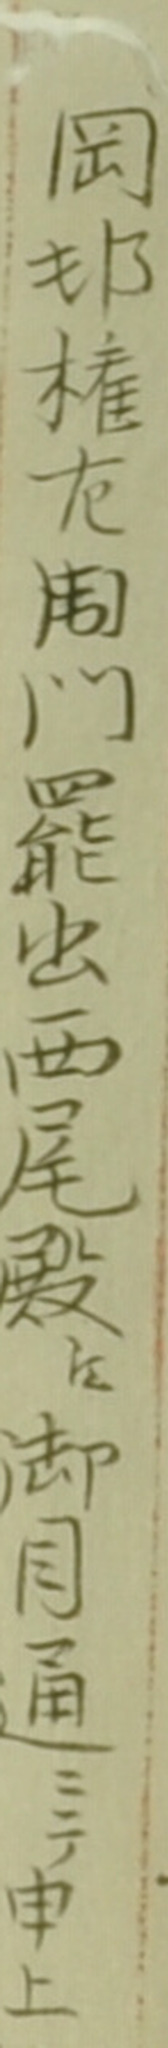岡邨権左衛門罷出西尾殿江御目通ニテ申上候

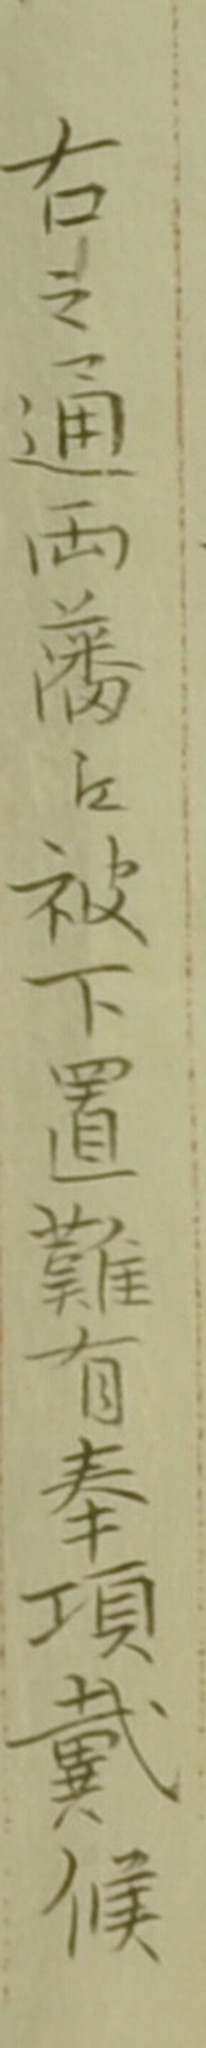右之通両藩江被下置難有奉頂戴候
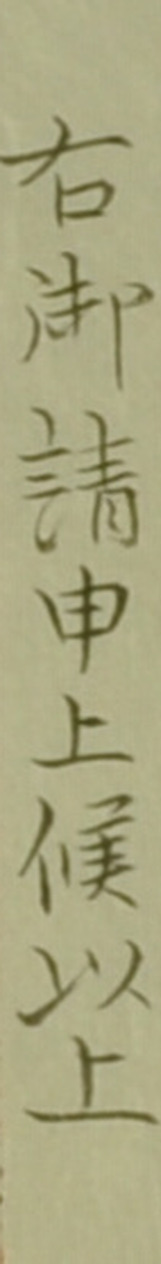右御請申上候以上
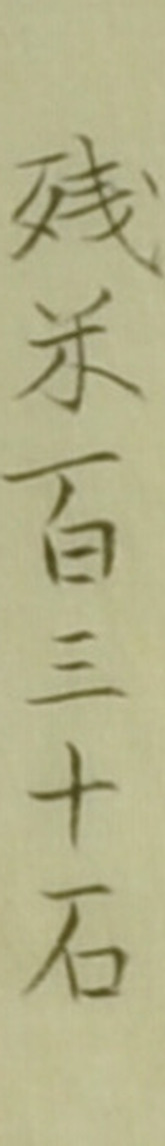残米百三十石
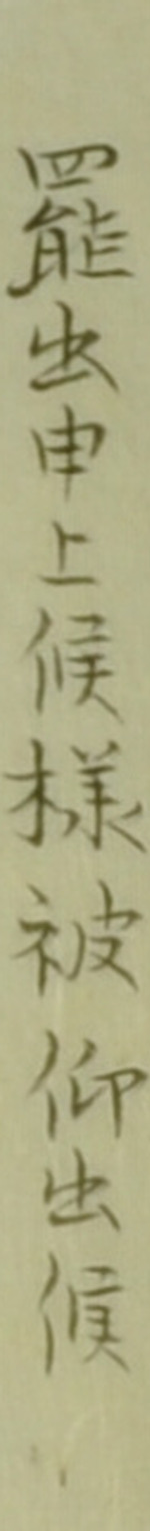罷出申上候様被仰出候
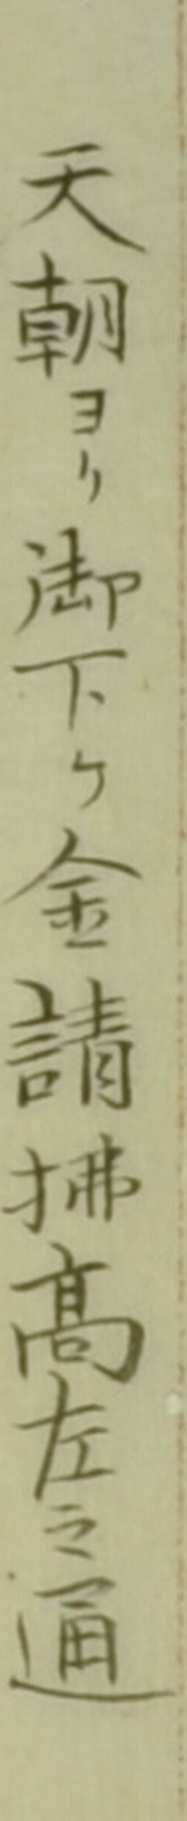一天朝より御下け金請払高左之通
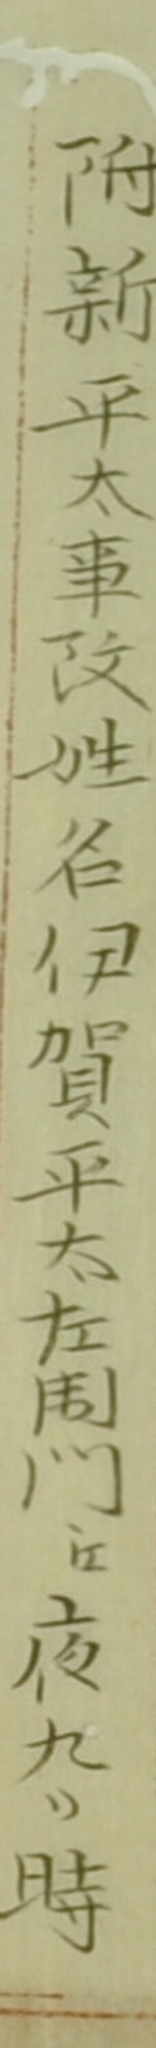附新平太事改姓名伊賀平太左衛門江夜九ツ時
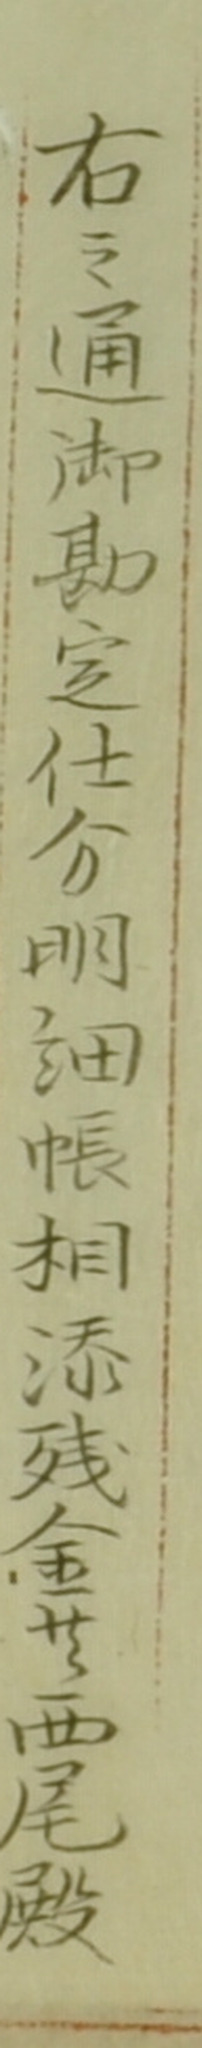右之通御勘定仕分明細帳相添残金共西尾殿
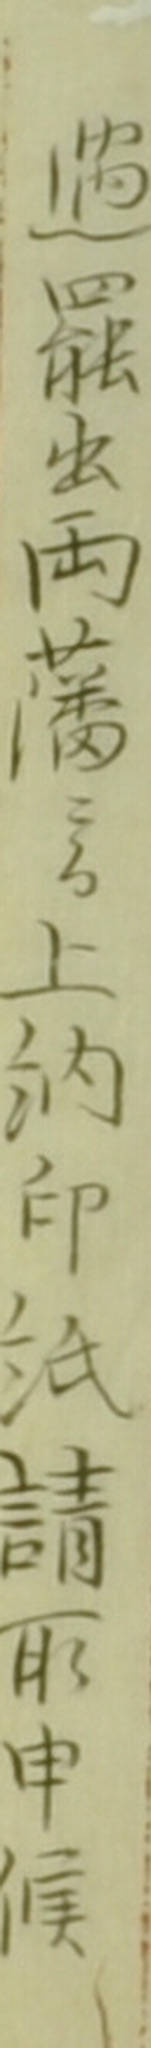過罷出両藩ニテ上納印紙請取申候

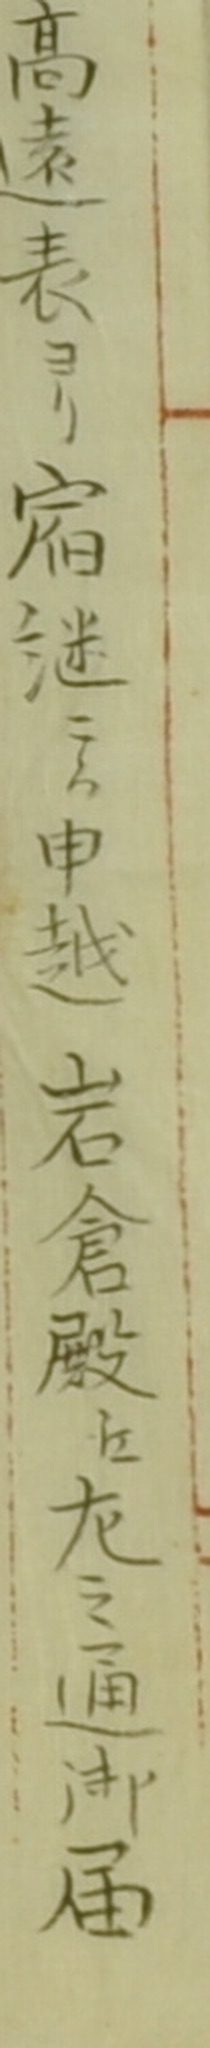一高遠表ヨリ宿継ニテ申越岩倉殿江左之通御届
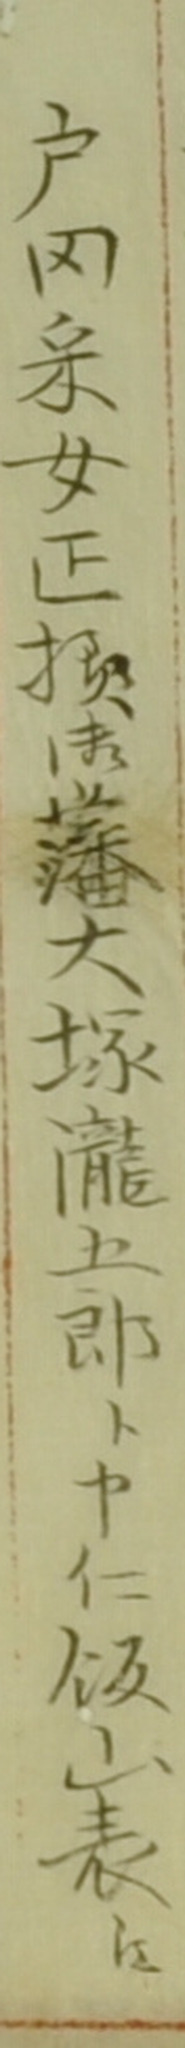戸田采女正様御藩大塚瀧五郎ト申仁飯山表江
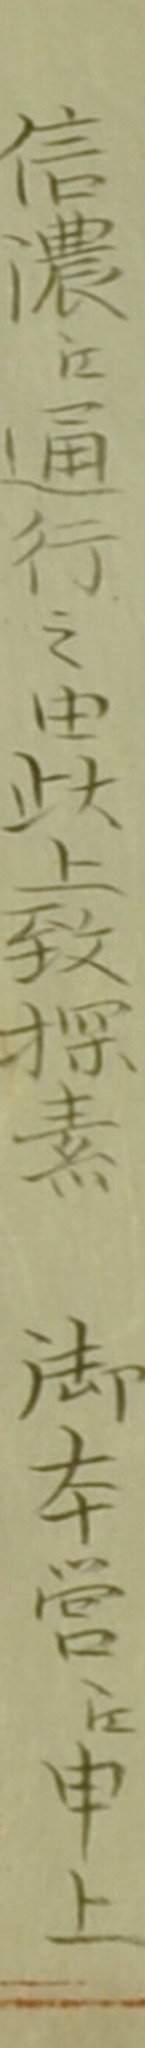信濃江通行之由此上致探索御本営江申上
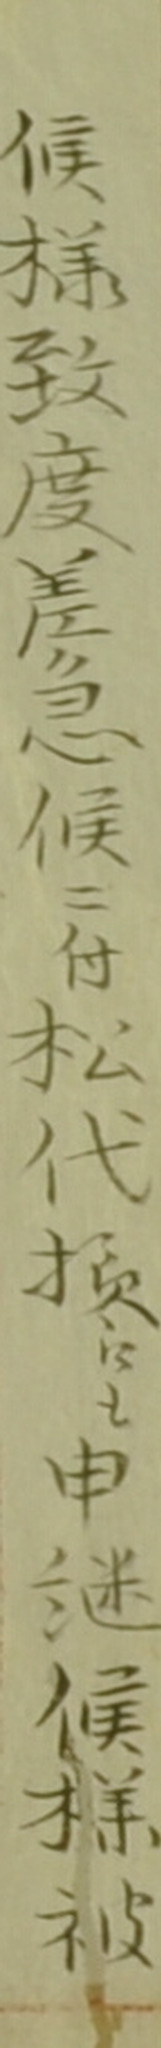候様致度差急候ニ付松代様江も申継候様被
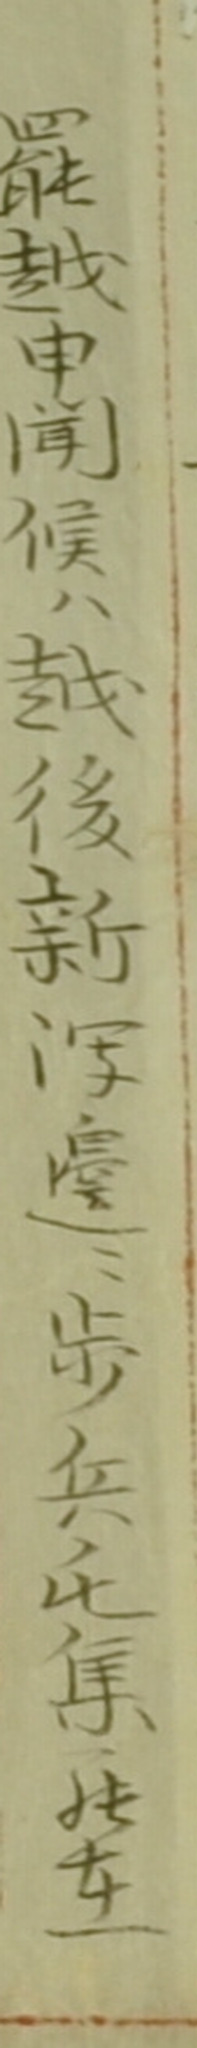罷越申聞候ハ越後新潟辺ニ歩兵屯集罷在
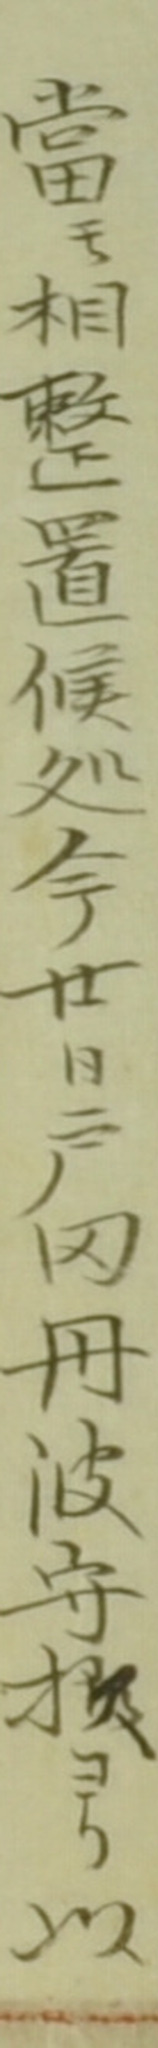当モ相整置候処今廿日戸田丹波守様ヨリ以
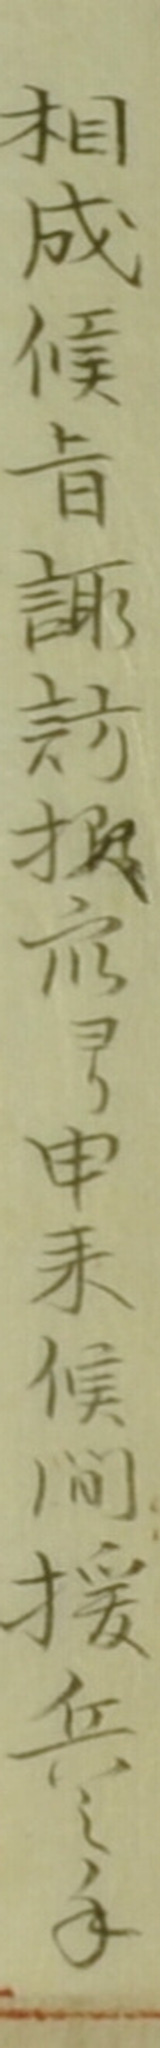相成候旨諏訪様衆ヨリ申来候間援兵之手
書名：御東征ニ付甲州口兵食人馬御賄之事件（控）
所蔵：伊那市立高遠町図書館・合同会社AMANE
